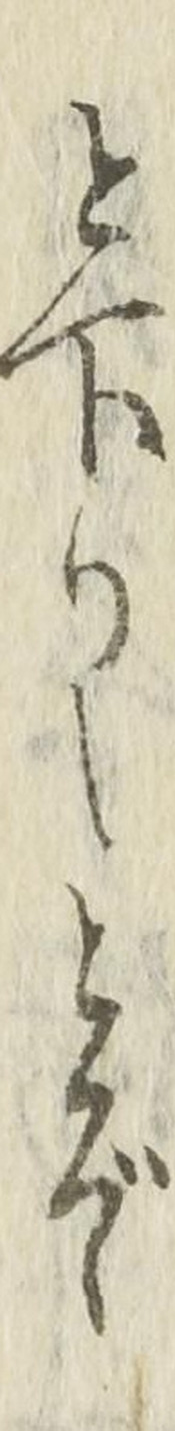と下りしとぞ
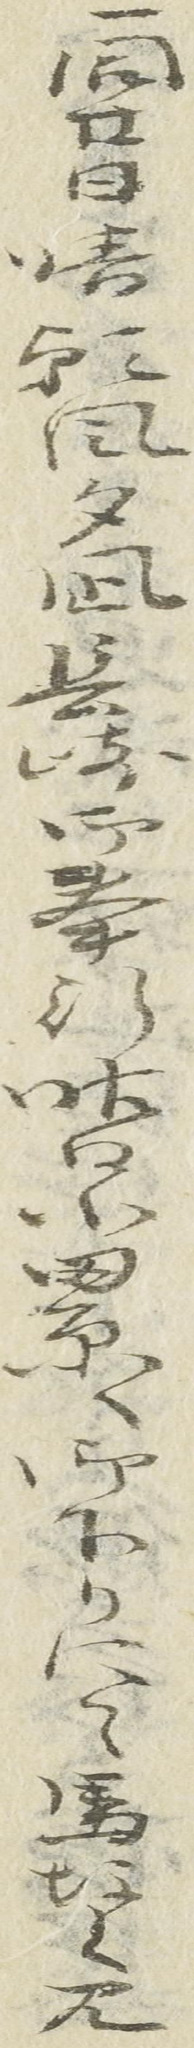一同廿日晴朝風夕凪長崎御奉行昨日小田原へ御下りにて馬なく見
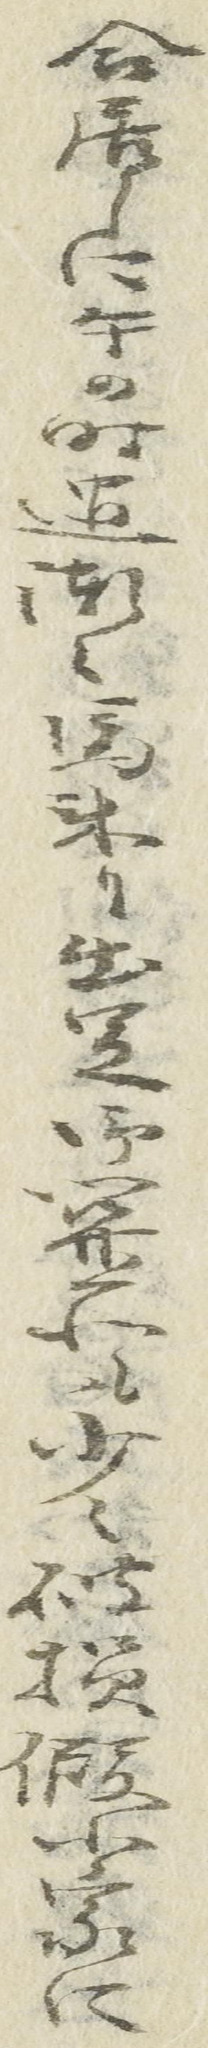合居しに午の時過漸く馬来り出足御関所も少々破損假小屋に
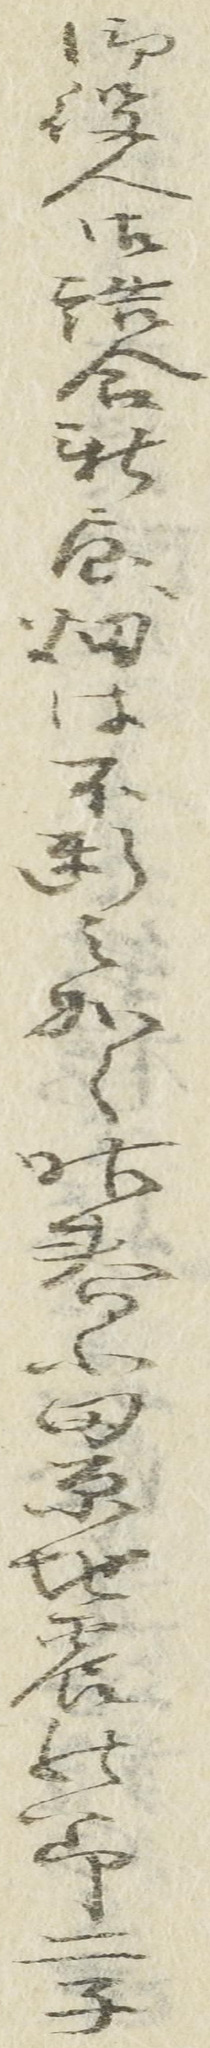御役人御詰合新屋畑は不断之如く昨春小田原地震の節二子
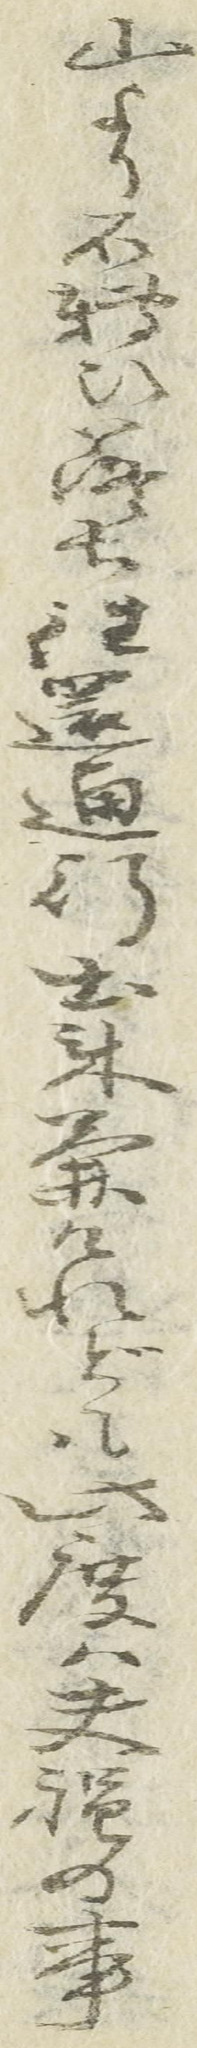山より石轉ひ落ち往還通行出来兼けれども此度ハ夫程の事
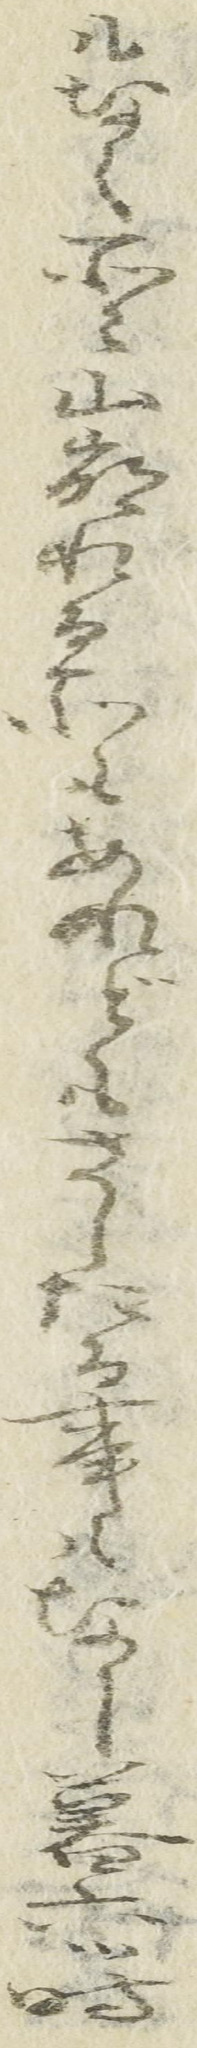もなく所々山崩れるところもあれどもさしたる事もなし暮六ツ時
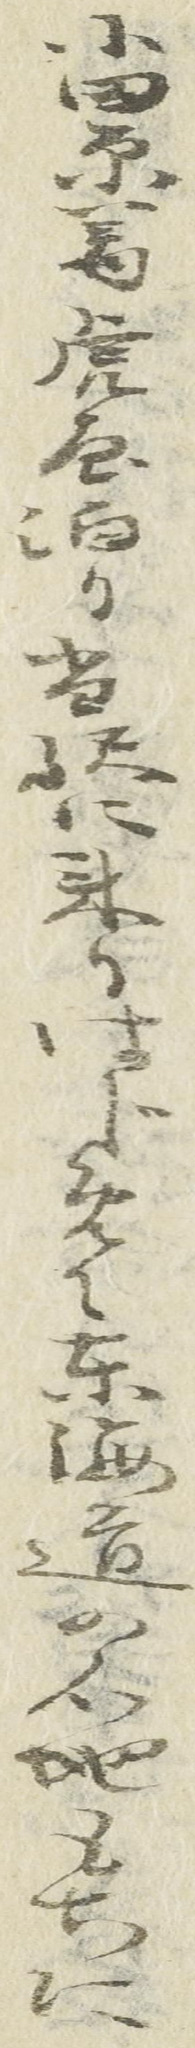小田原着虎屋泊り当駅に来りはじめて東海道の心地もちに
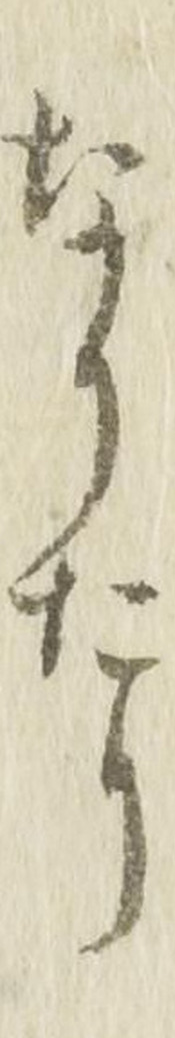なりたり
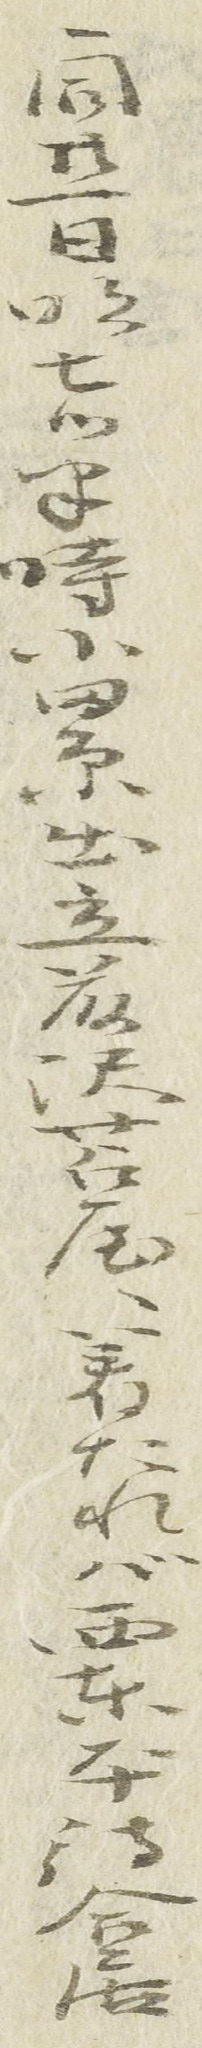一同廿一日明七ツ半時小田原出立藤沢苫屋へ着たれバ西東平待合居
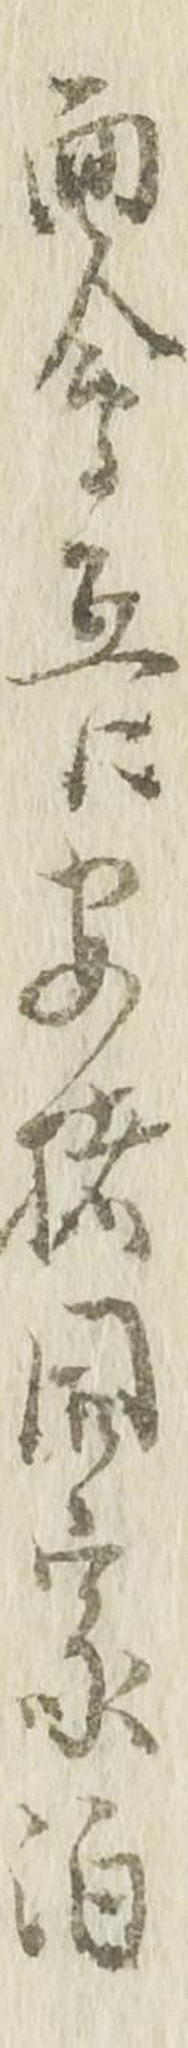面会互に安堵同家泊
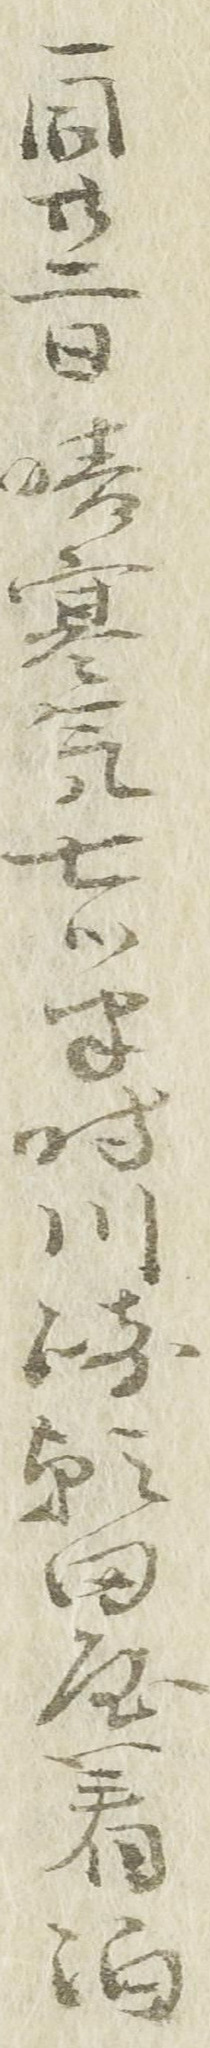一同廿二日晴寒気七ツ半時川崎朝田屋着泊
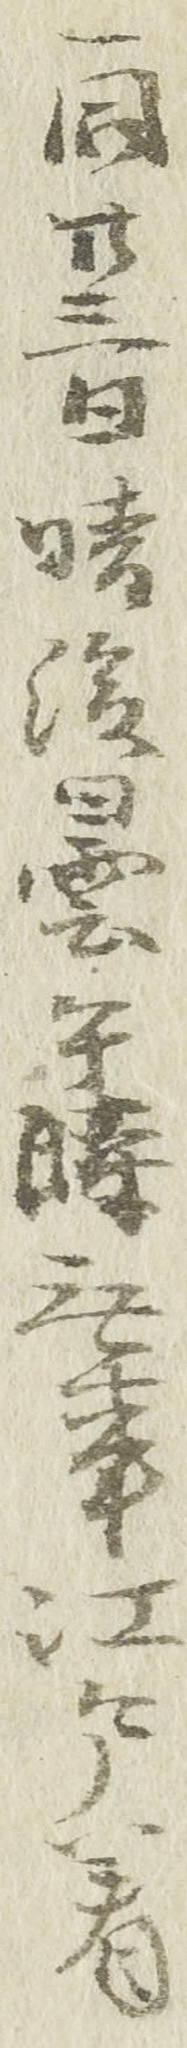一同廿三日晴後曇午時無事江戸着

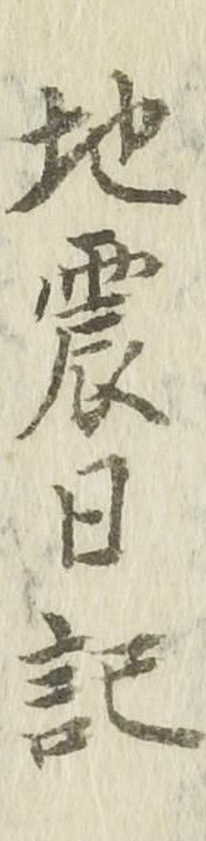地震日記
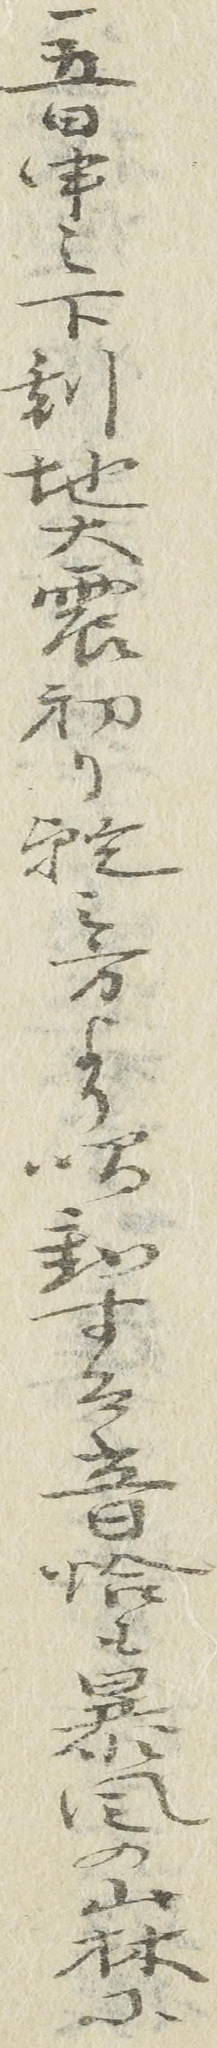一五日申之下刻地大震初り乾之方より鳴動する音恰も暴風の山林に
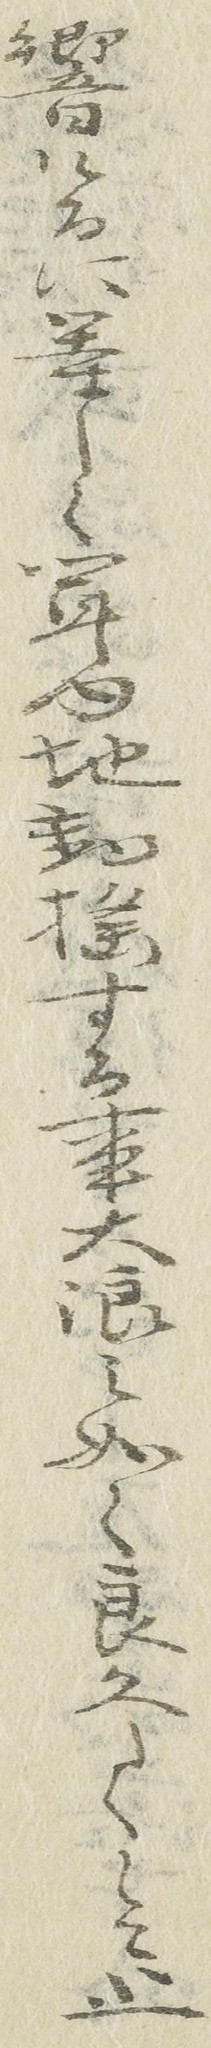響けるに等しく聞ゆ地動揺する事大浪之如く良久しくして止
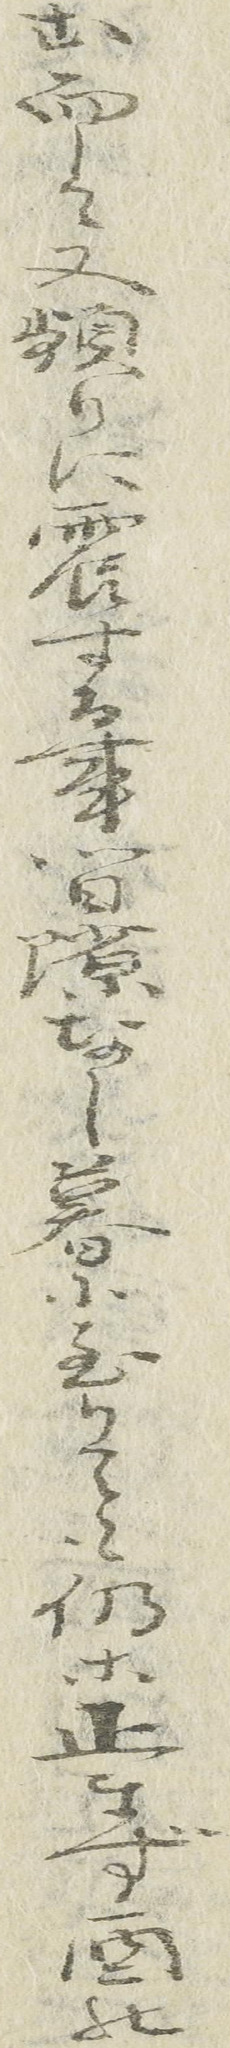出而して又頻りに震する事間隙なし暮に至りても仍ほ止まず酉の
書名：地震前兆集　全
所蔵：東京大学地震研究所図書室 Earthquake Research Institute Library, The University of Tokyo, JAPAN
